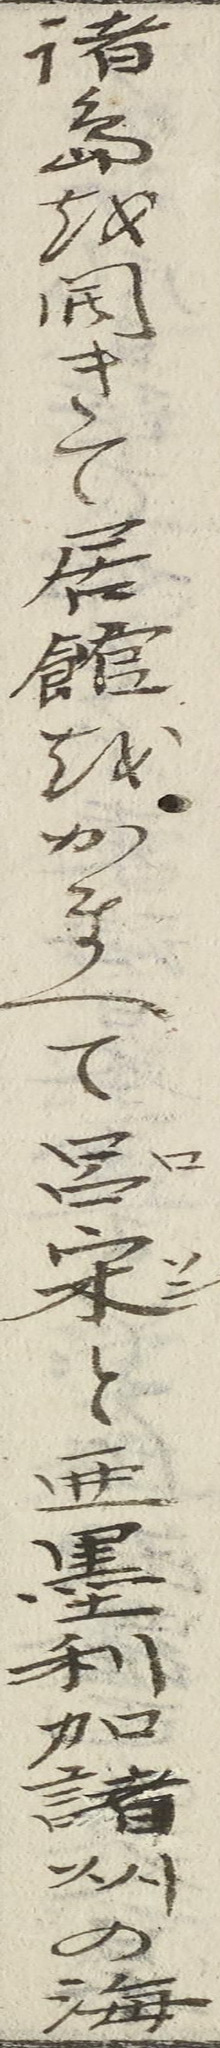諸島を開きて居館をかまへて呂宋と亜墨利加諸州の海
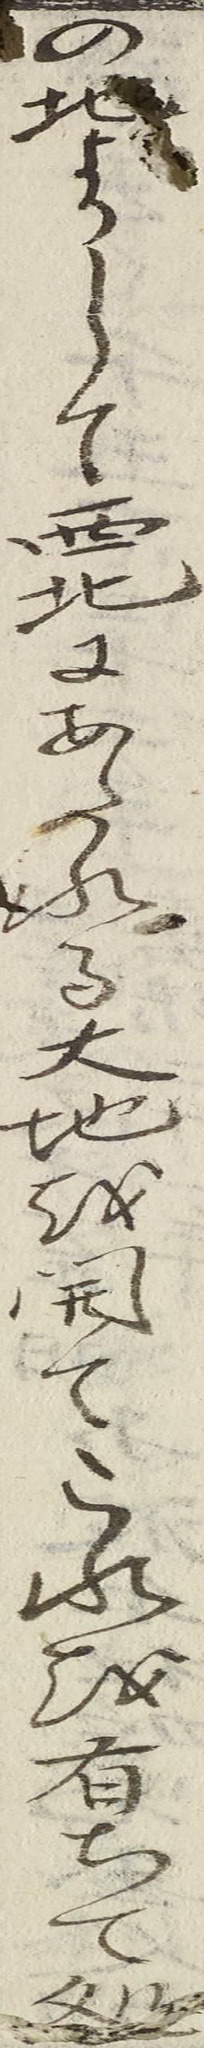の地よりして西北にあたれる大地を開てこれを有ちて処
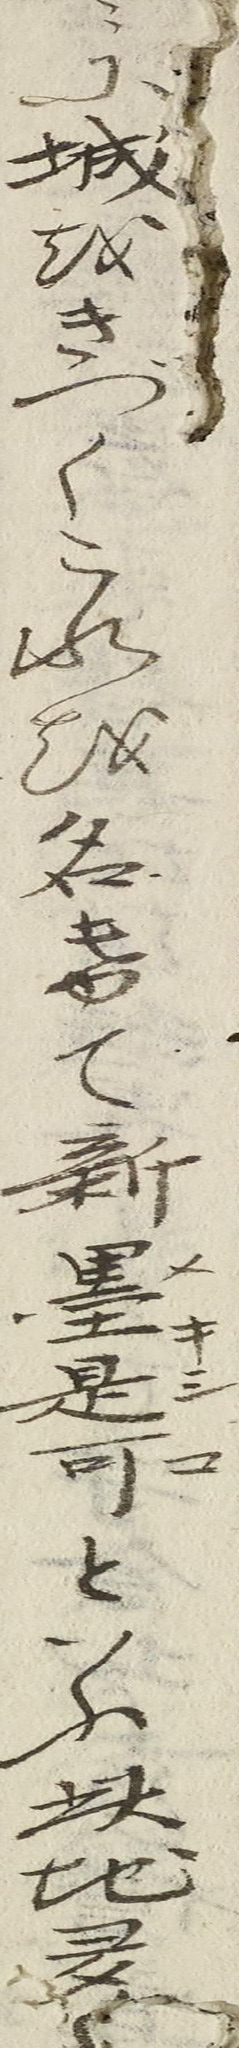々に城をきづくこれを名けて新墨是可といふ此地多く
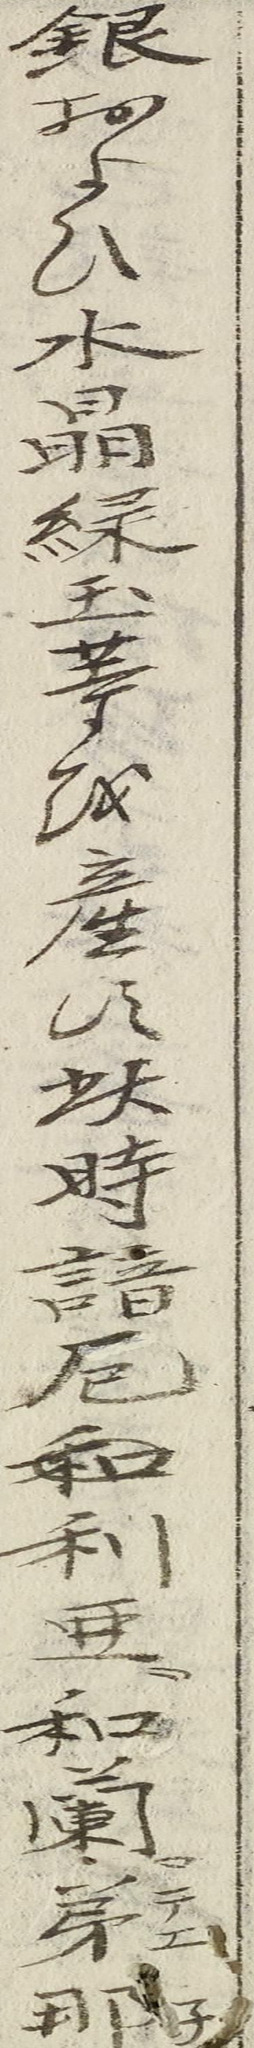銀およひ水晶繰玉華を産す此時諳厄和利亜和蘭弟那
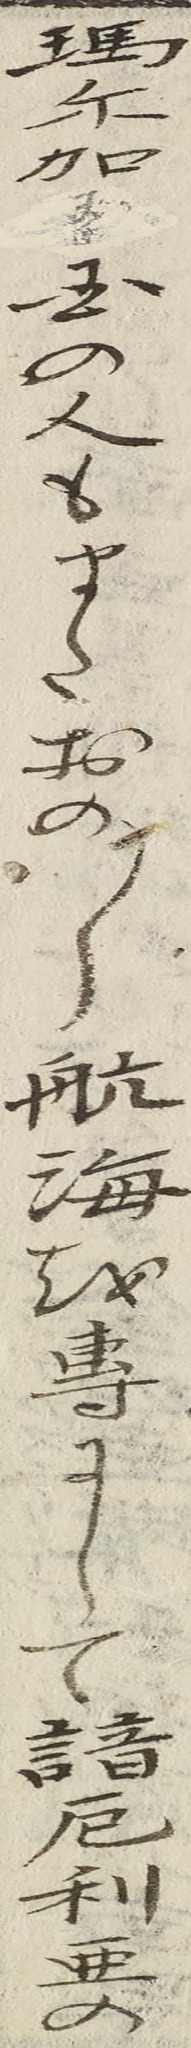瑪尓加国の人もまたおの〳〵航にして諳厄利亜の
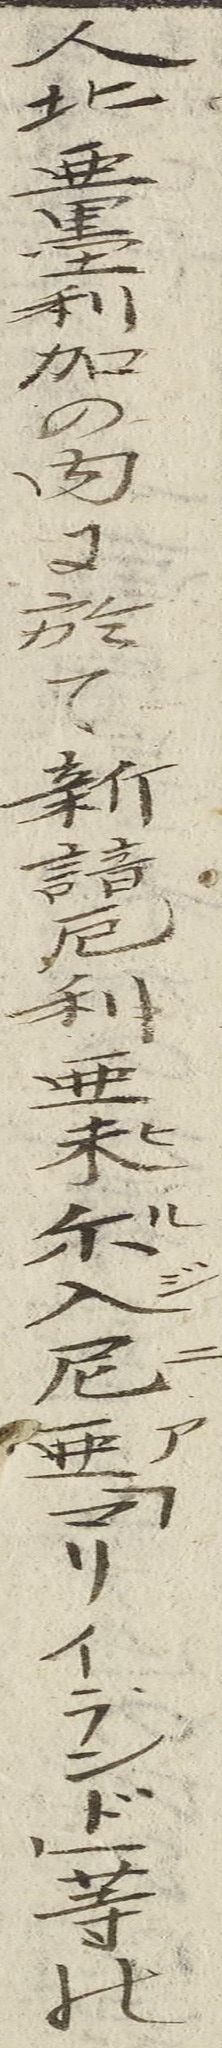人北亜墨利加の内に於て新諳厄利亜未尓入尼亜「マリイランド」等の
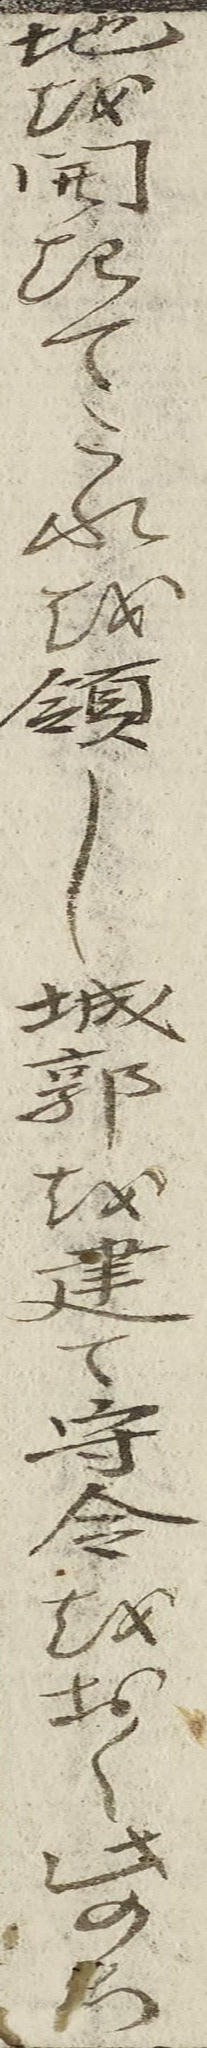地を開きてこれを領し城郭を建て守令をおく此のち
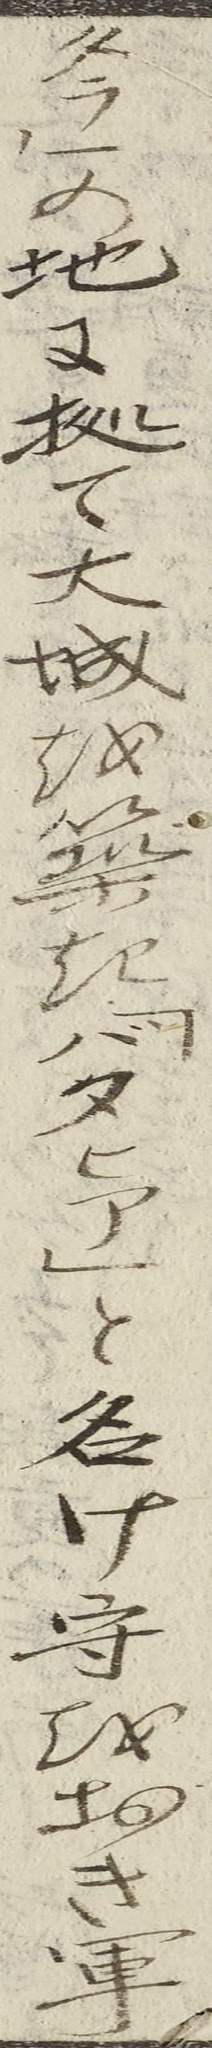タラ」の地に拠て大城を築き「バタヒア」と名け守をおき軍
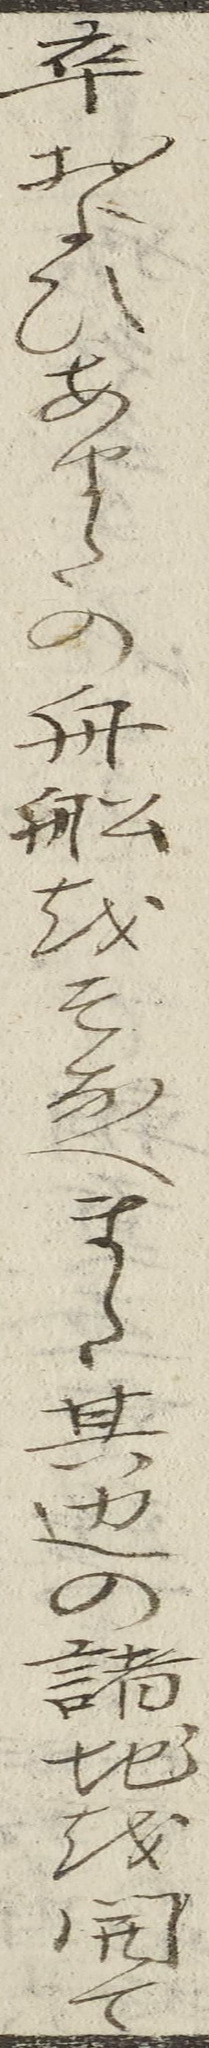卒およひあまたの舟船をそなへまた其辺の諸地を開て
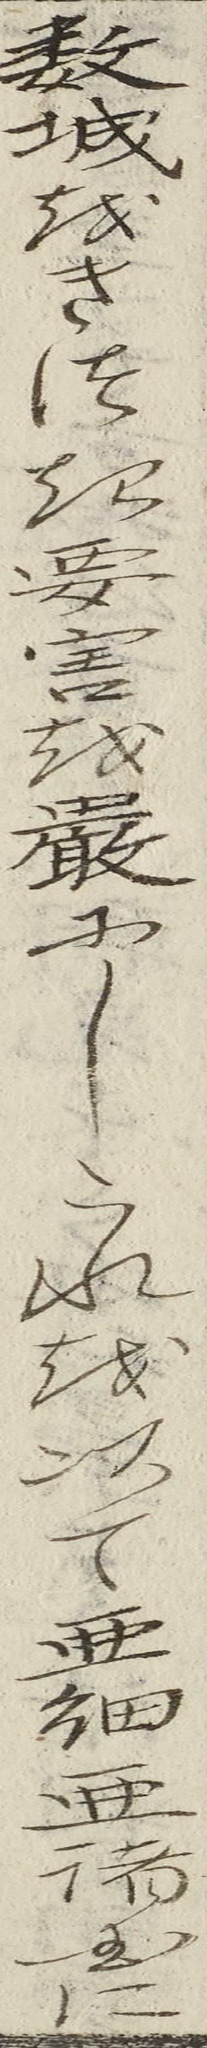教城をきすき要害を厳にしこれを以て亜細亜諸国に
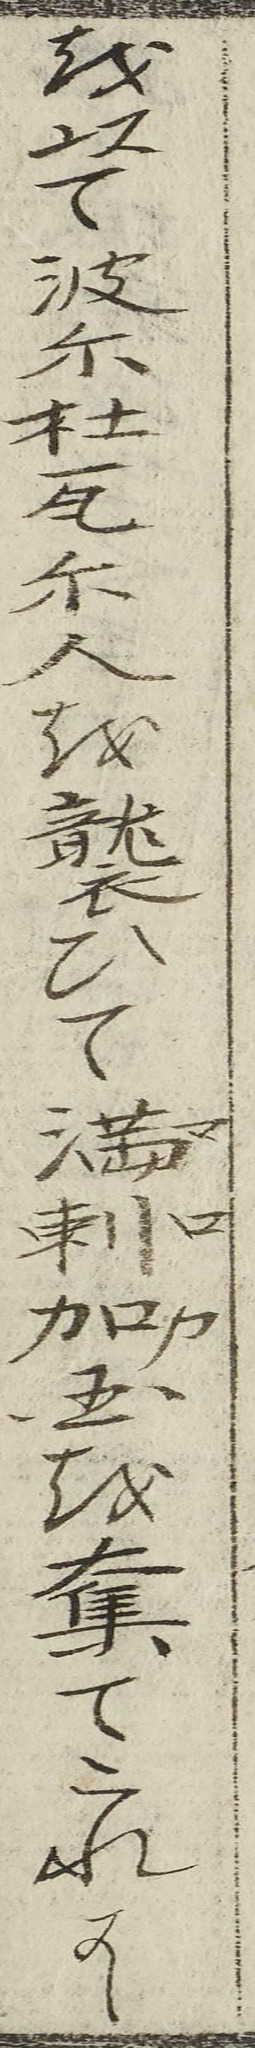を以て波尓杜亙尓人を襲ひて満刺加国を奪てこれに

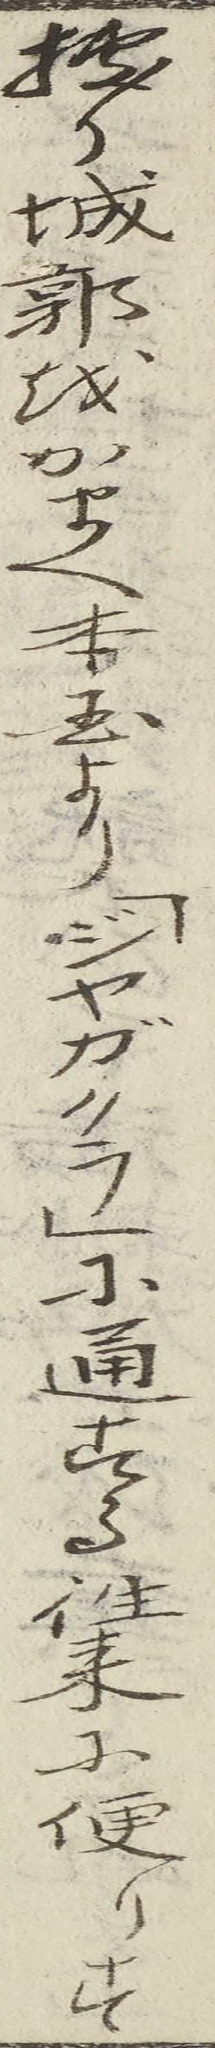拠り城郭をかまへ本国より「ジャガタラ」に通する往来に便りす
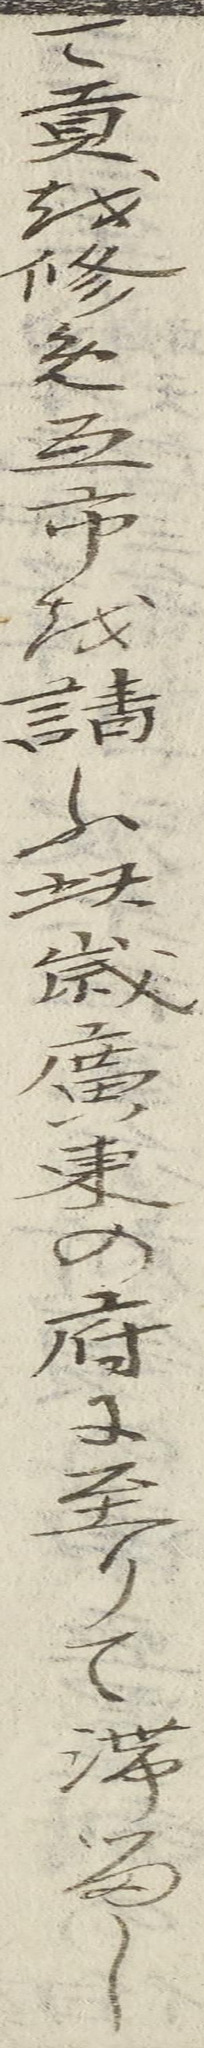て貢を修め互市を請ふ此歳広東の府に至りて滞留し
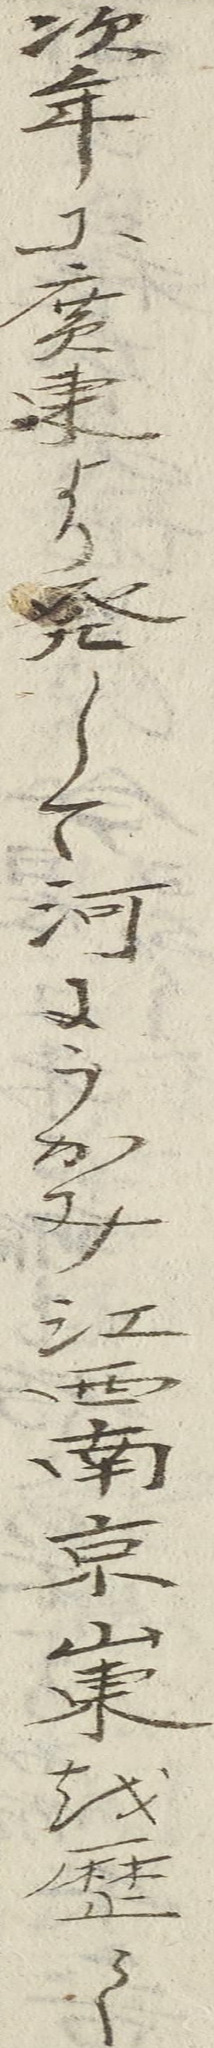次年に広東より発して河にうかみ江西南京山東を歴て
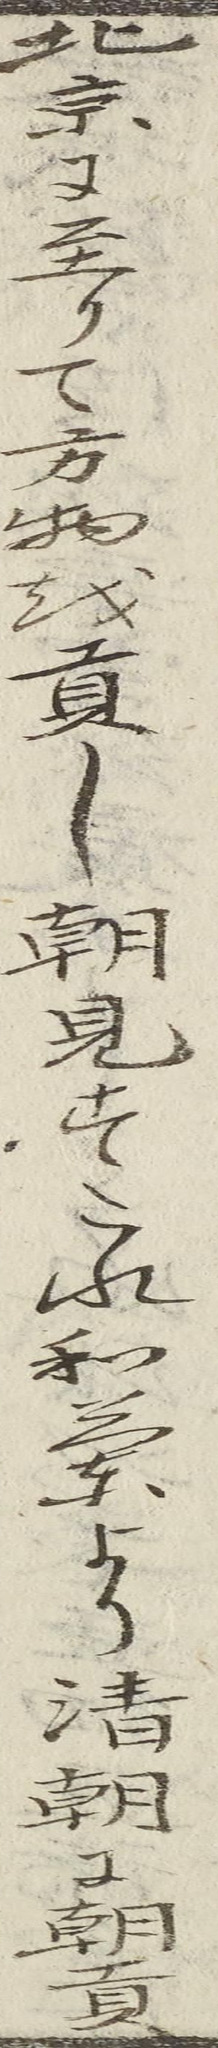北京に至りて方物を貢し朝見すこれ和蘭より清朝に朝貢
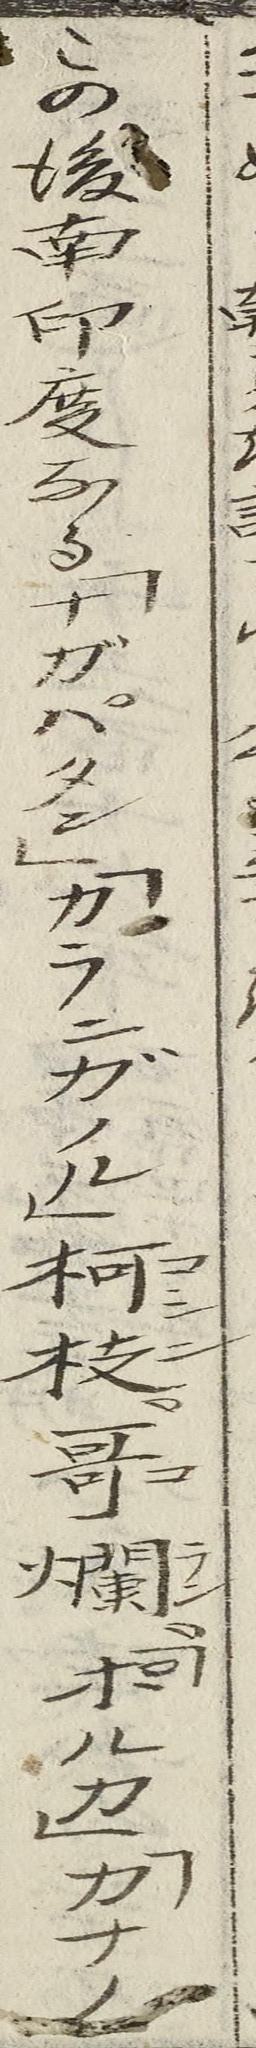この後南印度なる「ナガパタン」「カラ二ガノル柯枝。哥爛。「ポルカ」「カナノ
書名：西洋雜記　乾
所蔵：東京大学地震研究所図書室 Earthquake Research Institute Library, The University of Tokyo, JAPAN
